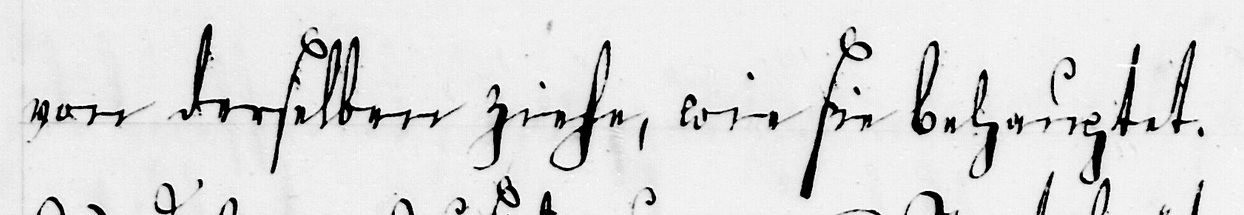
von derselben ziehe, wie sie behauptet.
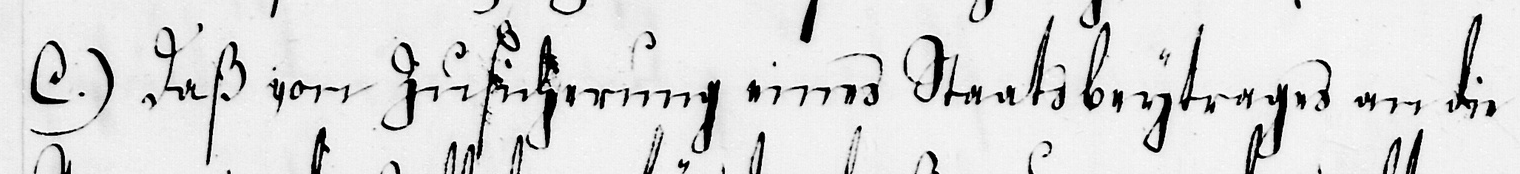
C.) Daß von Zusicherung eines Staatsbeytrages an die
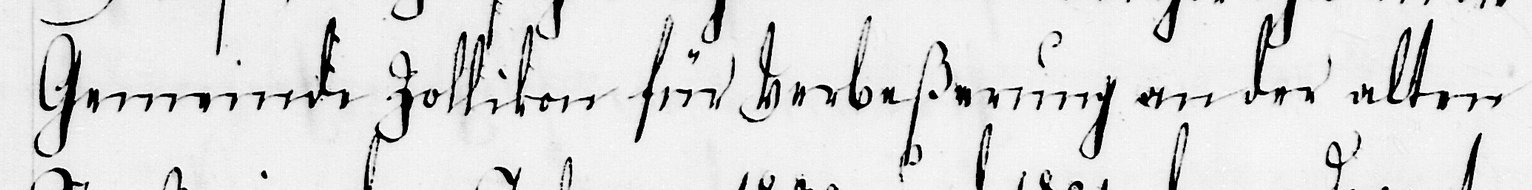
Gemeinde Zollikon für Verbeßerung an der alten
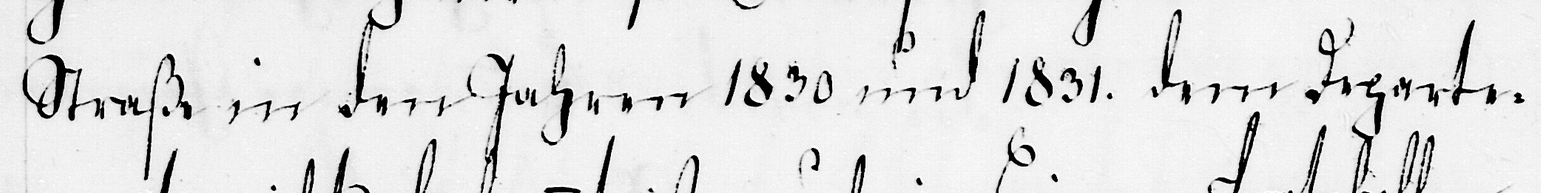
Straße in den Jahren 1830 und 1831. dem Departe¬
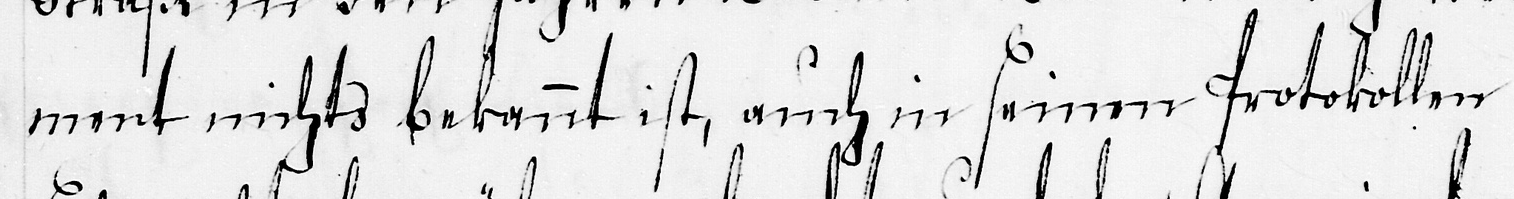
ment nichts bekannt ist, auch in seinen Protokollen
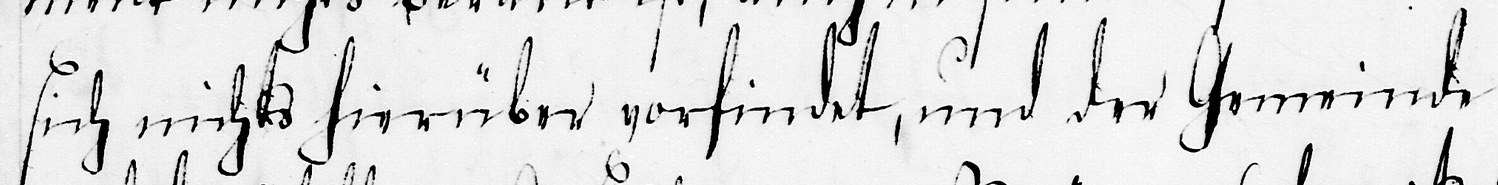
sich nichts hierüber vorfindet, und der Gemeinde
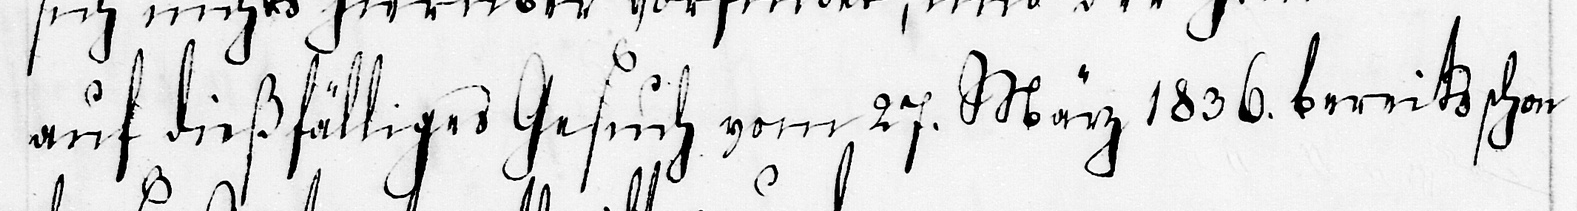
auf dießfälliges Gesuch vom 27. März 1836. bereits schon
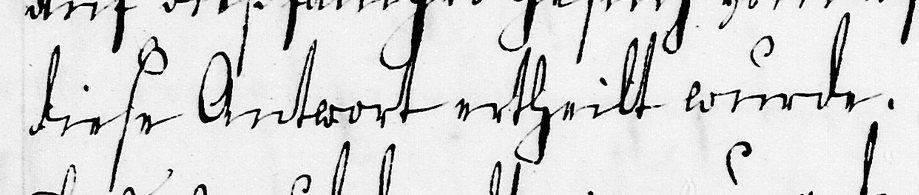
diese Antwort ertheilt wurde.
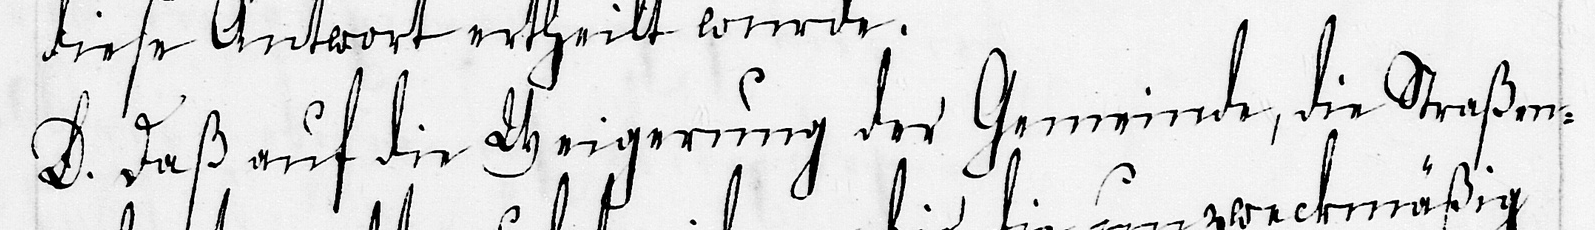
D. Daß auf die Weigerung der Gemeinde, die Straßen¬
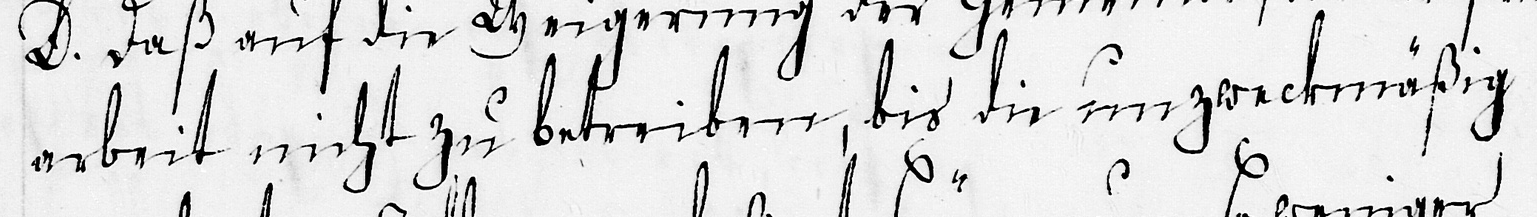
arbeit nicht zu betreiben, bis die unzweckmäßig
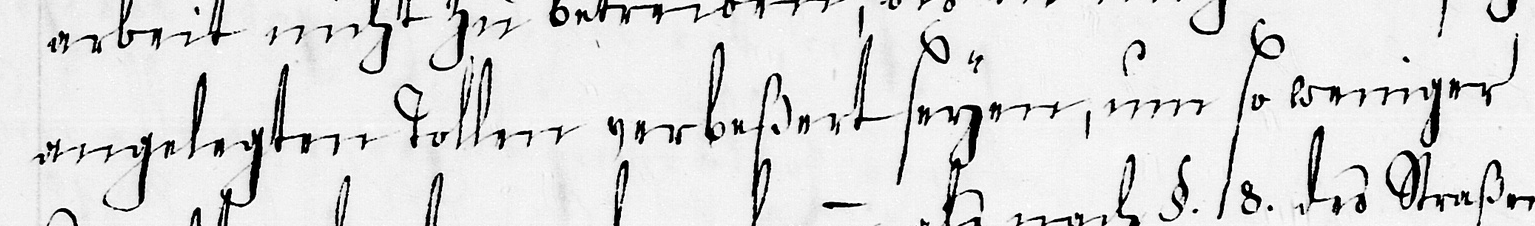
angelegten Tollen verbeßert seyen, um so weniger
